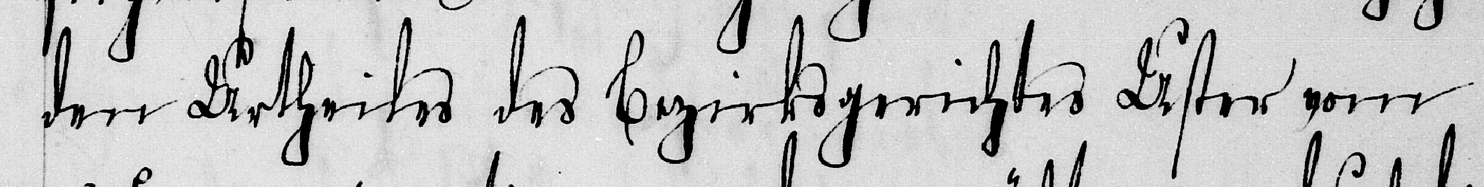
den Urtheiles des Bezirksgerichtes Uster vom
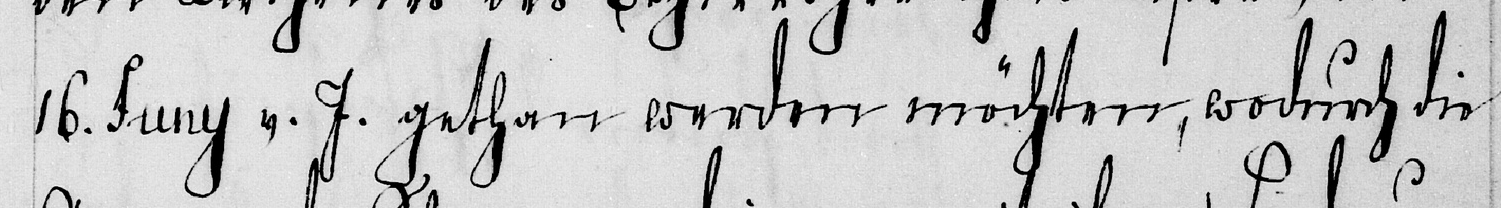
16. Juny v. J. gethan werden möchten, wodurch die
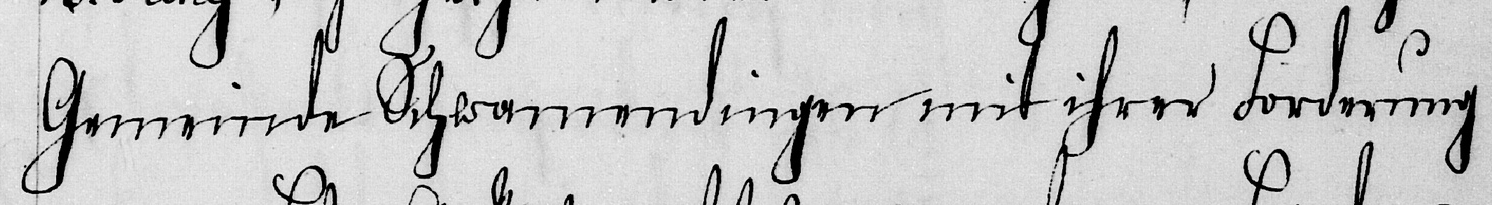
Gemeinde Schwamendingen mit ihrer Forderung
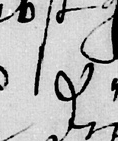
64.
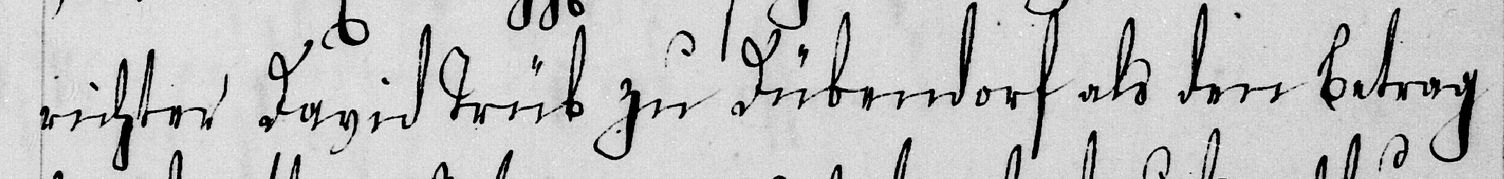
richter David Trüb zu Dübendorf als den Betrag
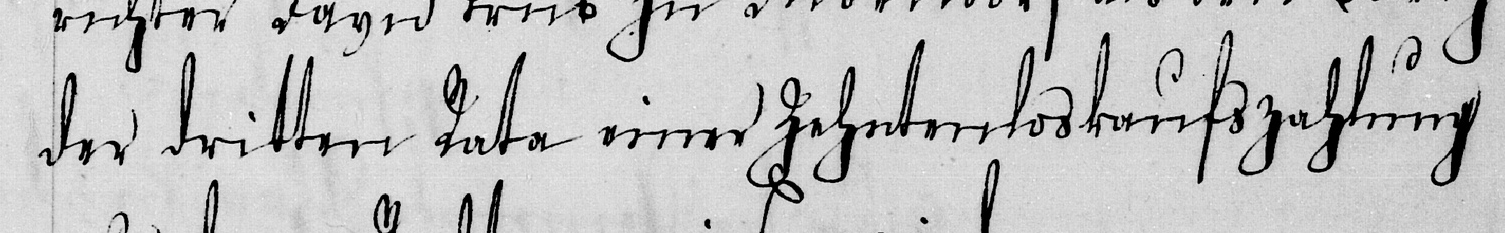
der dritten Rata einer Zehntenloskaufszahlung
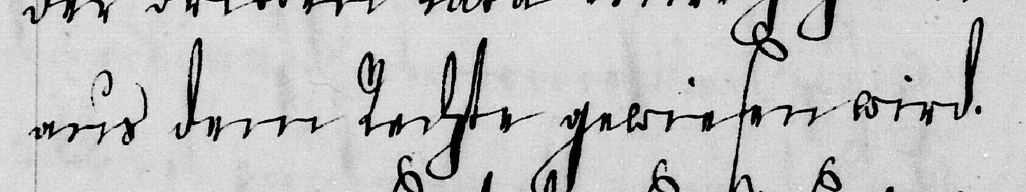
aus dem Rechte gewiesen wird.
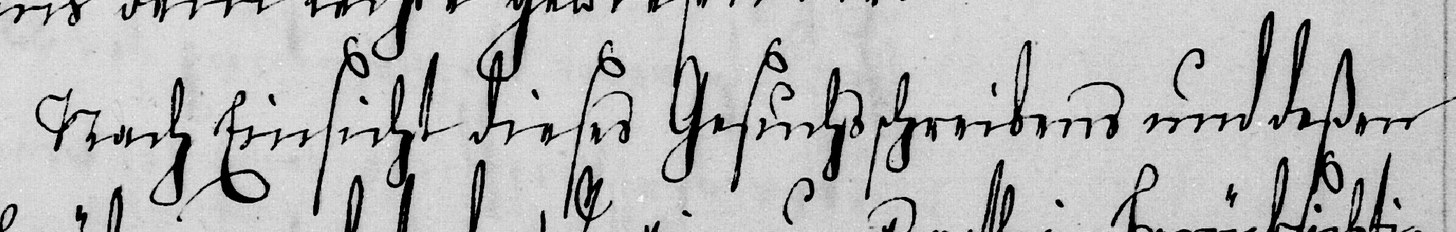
Nach Einsicht dieses Gesuchsschreibes und deßen
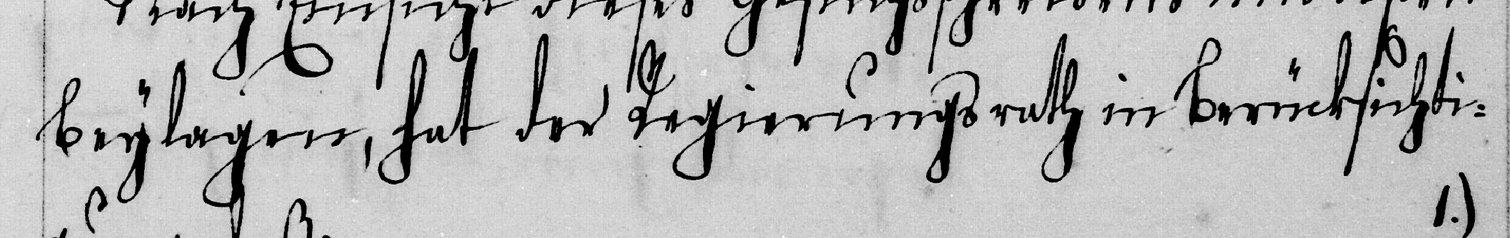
Beylagen, hat der Regierungsrath in Berücksichti¬
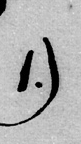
21.
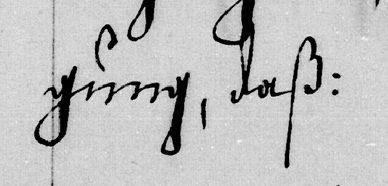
gung, daß:
